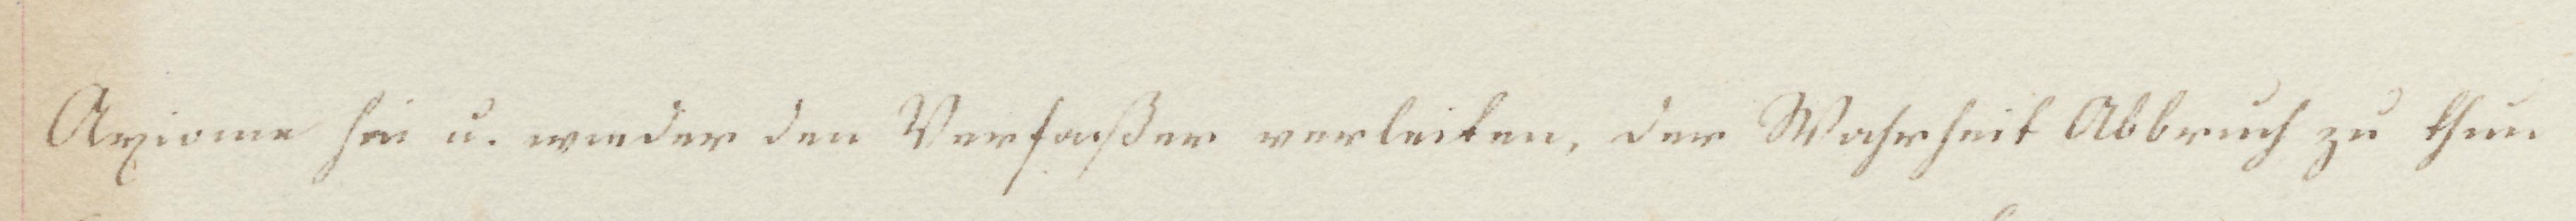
Axiome hin u. wieder den Verfaßer verleiten, der Wahrheit Abbruch zu thun.
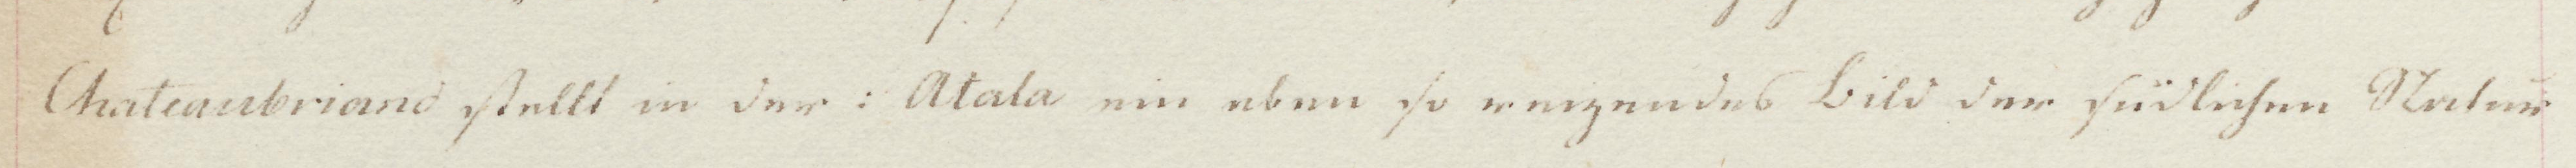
Chateaubriand stellt in der: Atala ein eben so reizendes Bild der südlichen Natur
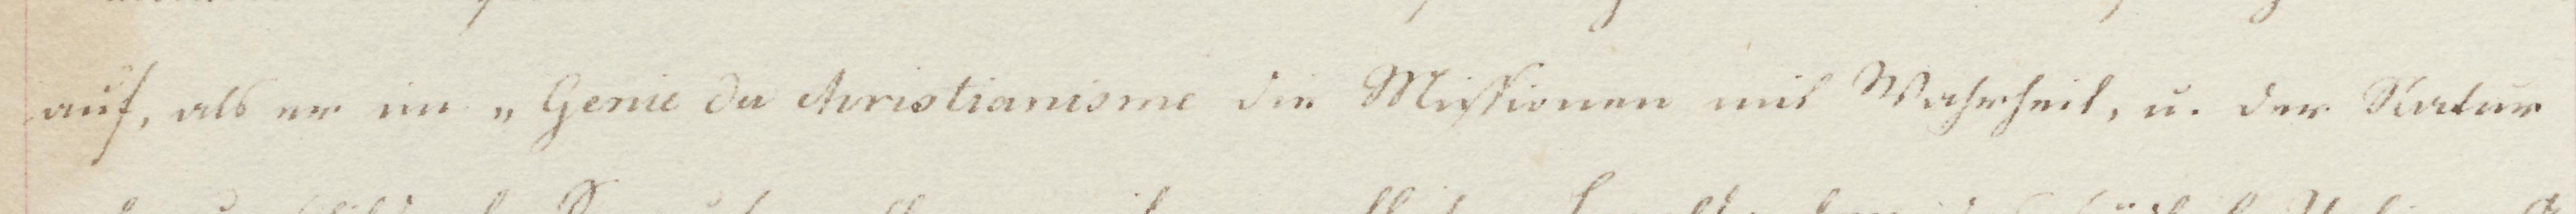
auf, als er im „Genie du christianisme die Missionen mit Wahrheit, u. der Natur
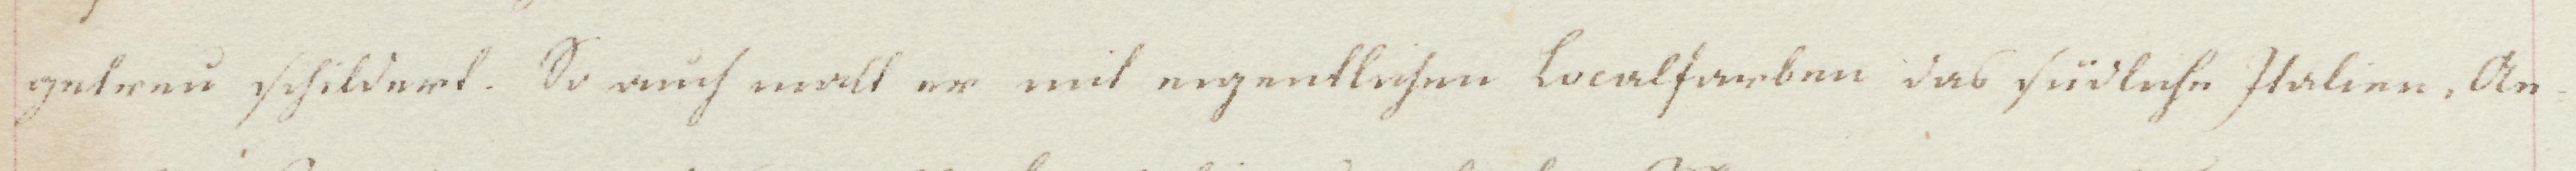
getreu schildert. So auch malt er mit eigentlichen Localfarben das südliche Italien, Ae-
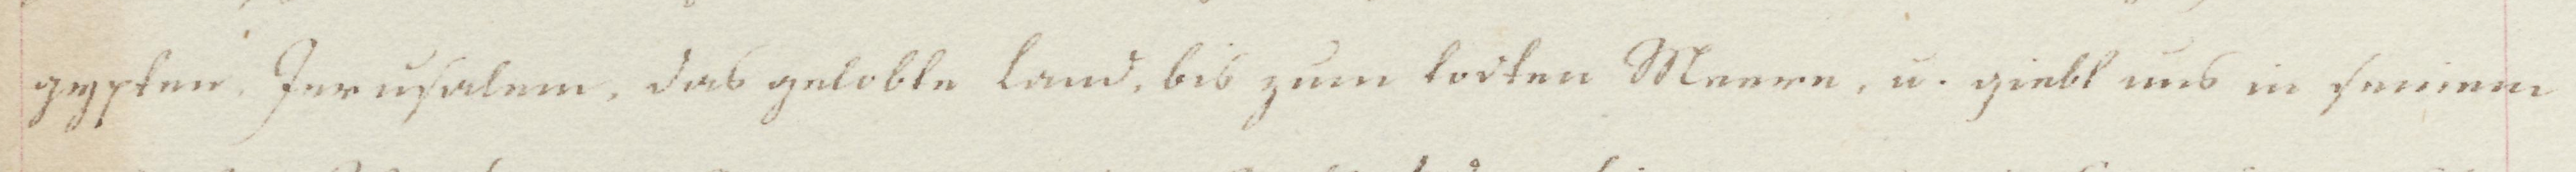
gypten, Jerusalem, das gelobte Land, bis zum todten Meere, u. giebt uns in seinem
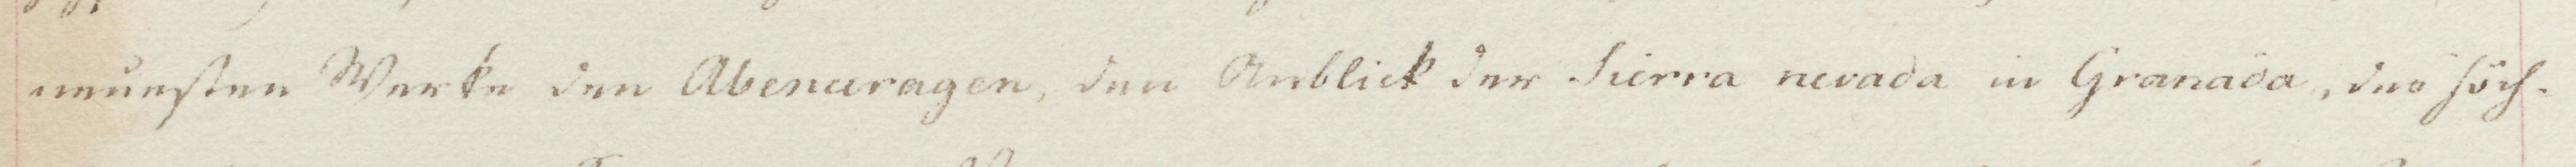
neuesten Werke den Abenceragen, den Anblick der Sierra Nevada in Granada, des höch-
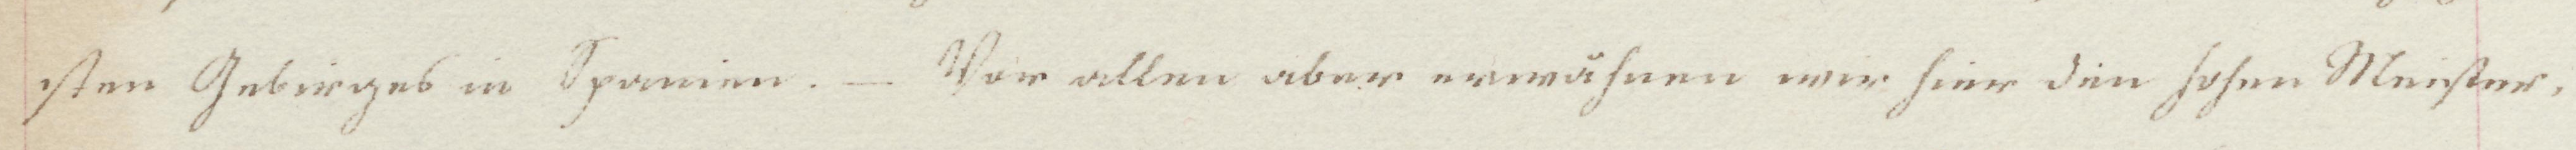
sten Gebirges in Spanien. – Vor allen aber erwähnen wir hier den hohen Meister,
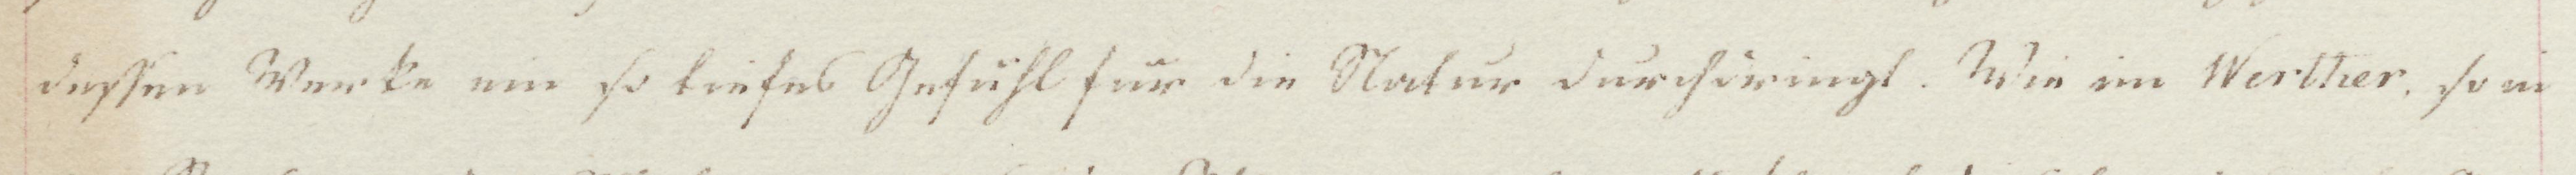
dessen Werke ein so tiefes Gefühl für die Natur durchdringt. Wie im Werther, so in
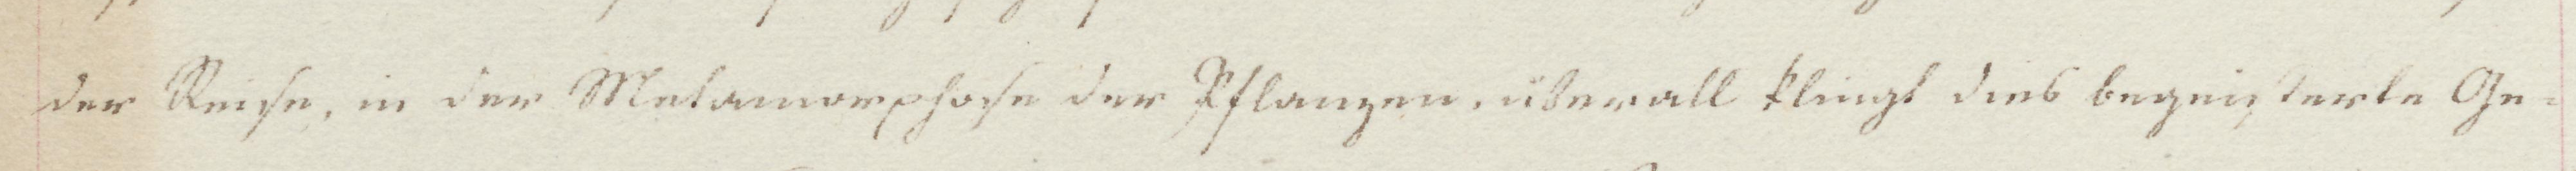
der Reise, in der Metamorphose der Pflanzen, überall klingt dies begeisterte Ge-
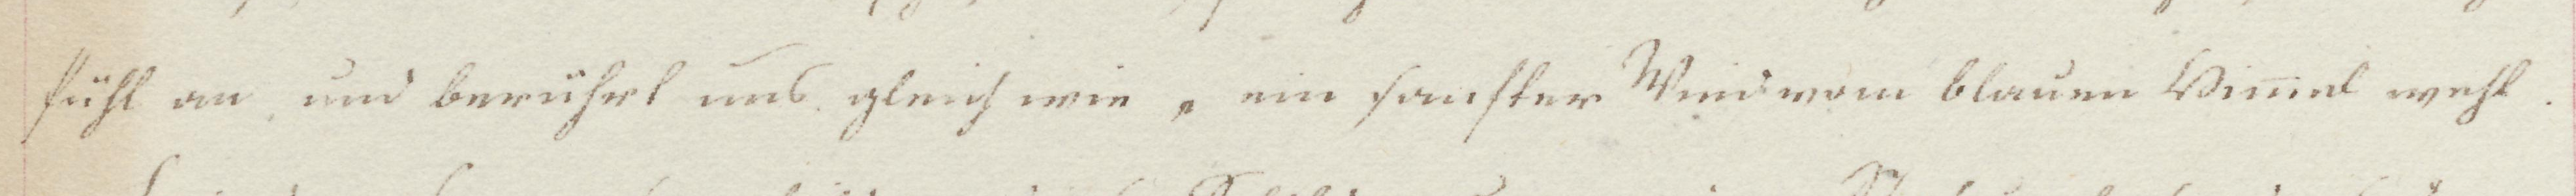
fühl an, und berührt uns, gleich wie „ein sanfter Wind vom blauen Him̃el weht.‟
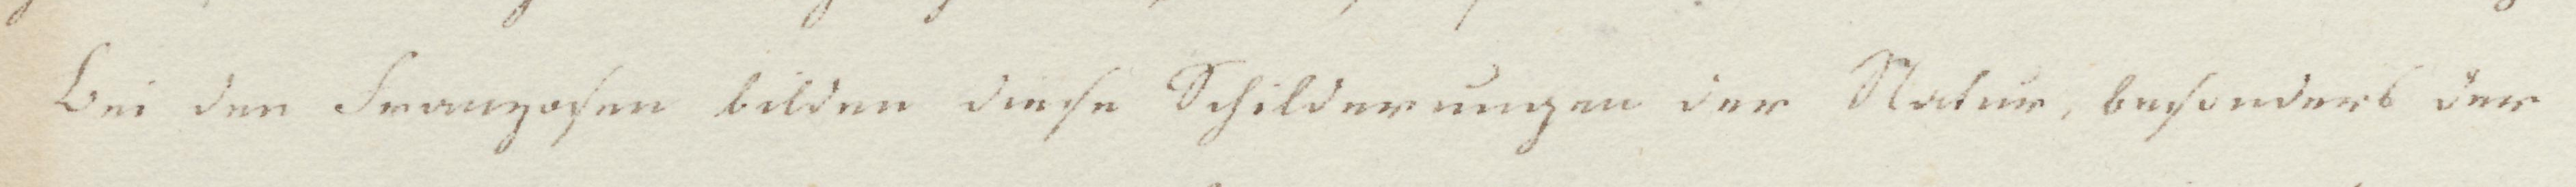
Bei den Franzosen bilden diese Schilderungen der Natur besonders der
